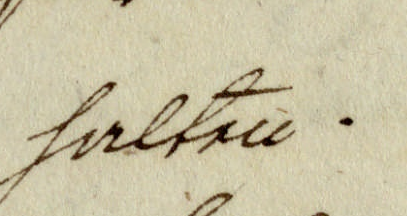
halten.
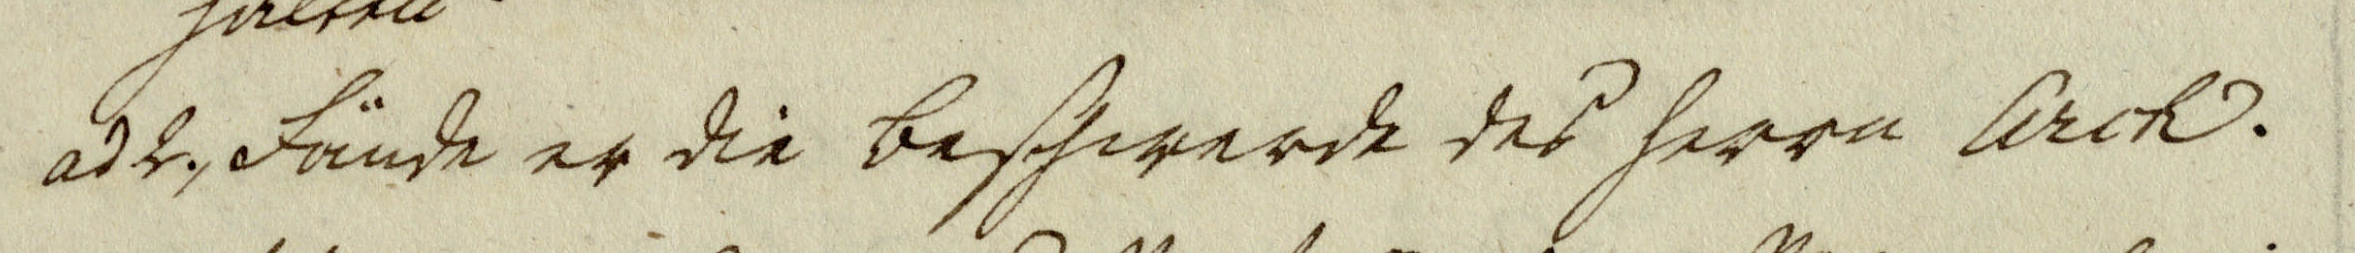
ad 2. Fände er die Beschwerden des Herrn Arch.
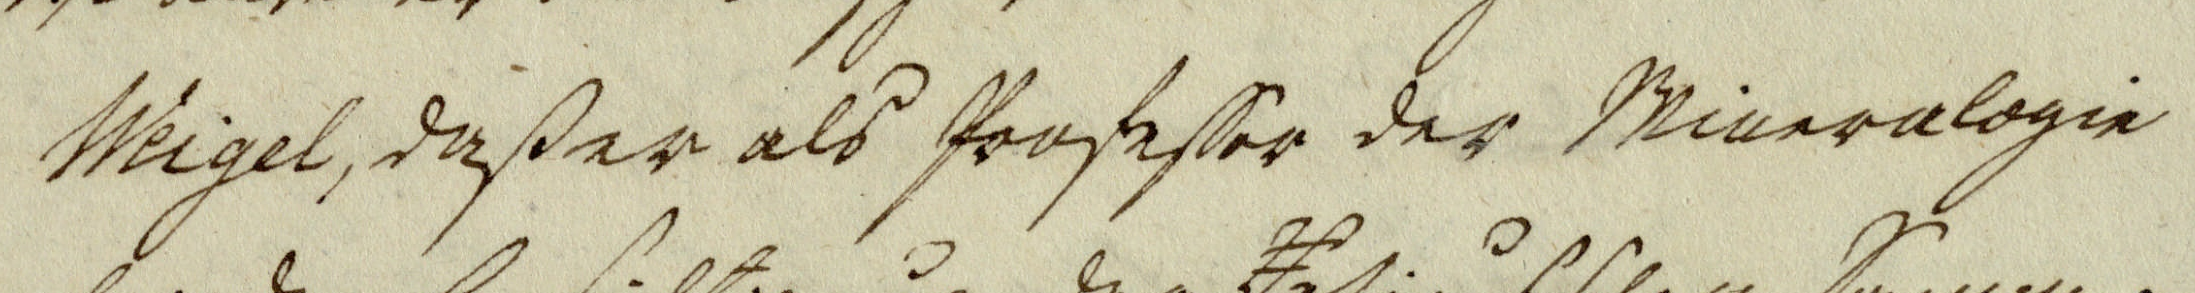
Weigel, daß er als Professor der Mineralogie
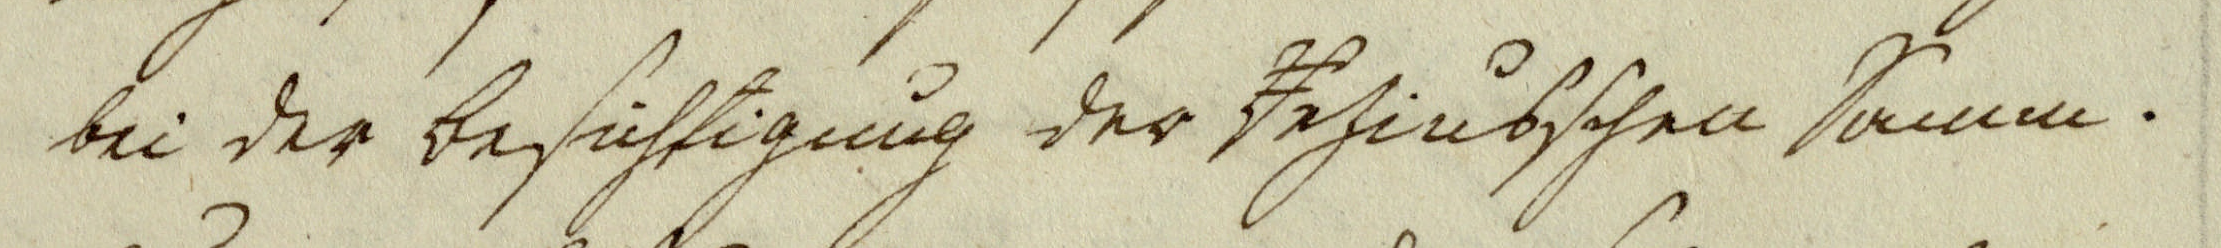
bei der Besichtigung der Reziusschen Samm¬
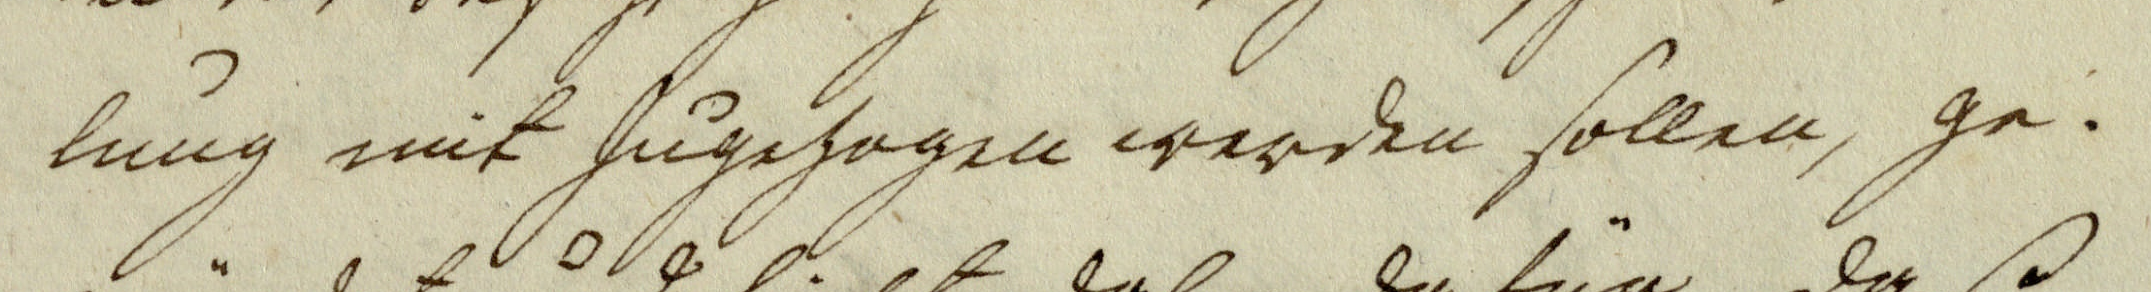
lung mit zugezogen werden sollen, ge¬
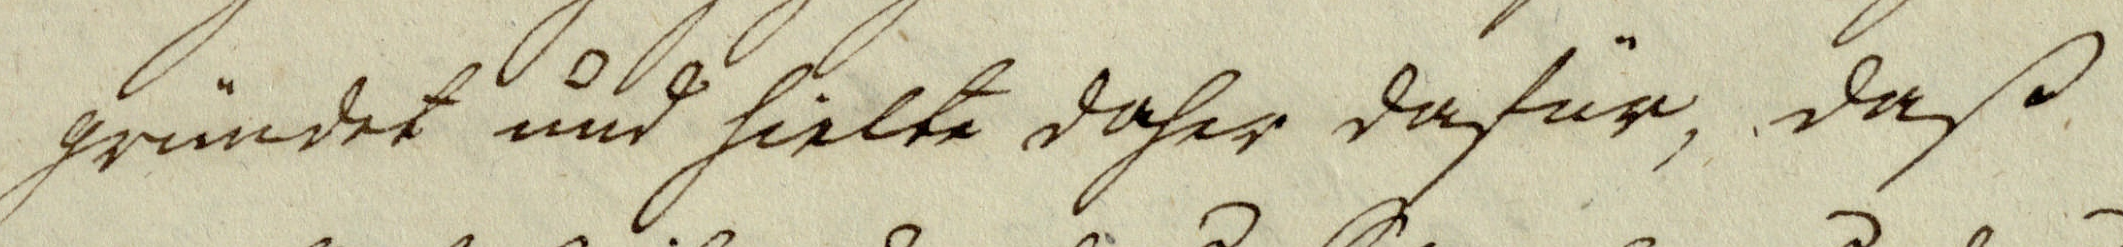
gründet und hielte daher dafür, daß
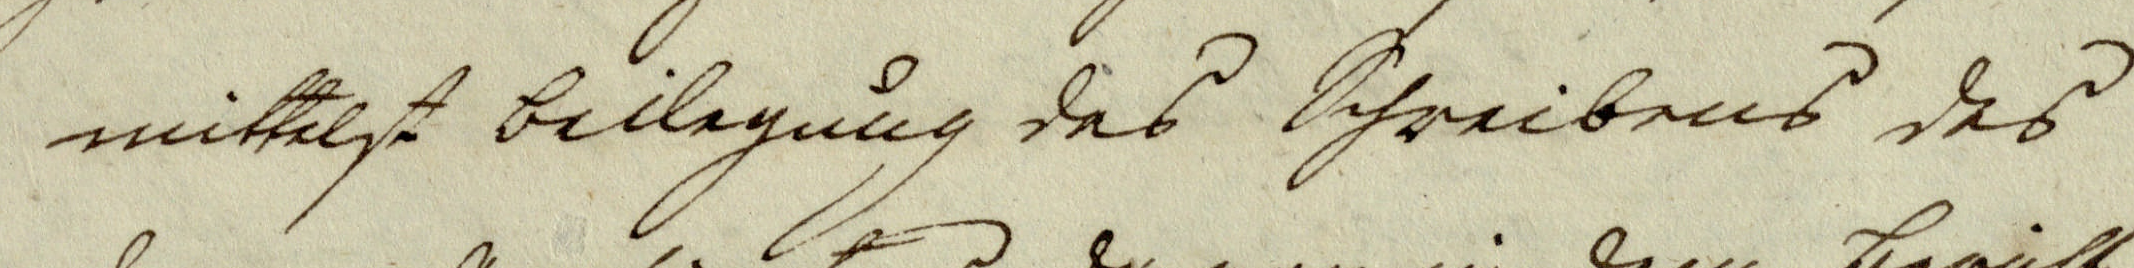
mittelst Beilegung des Schreibens des
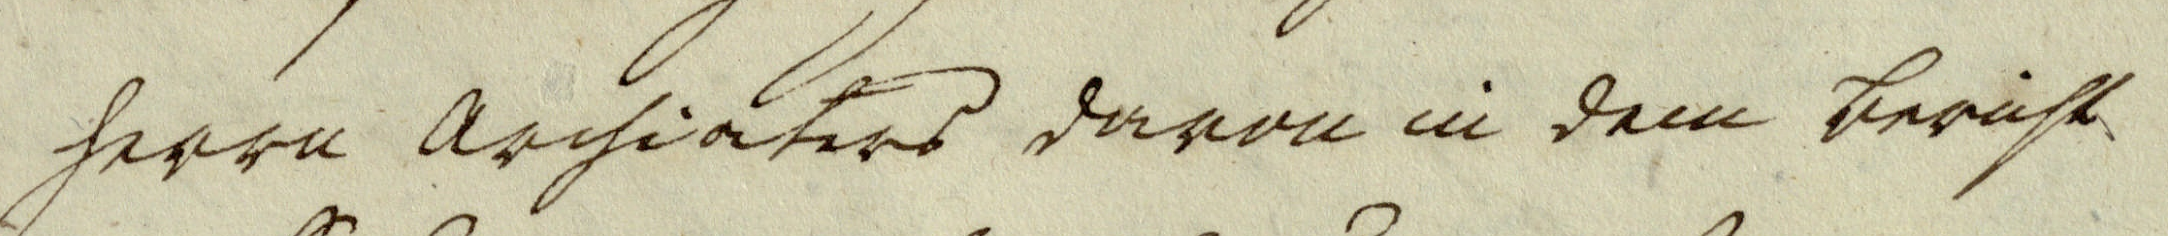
Herrn Archiaters davon in dem Bericht
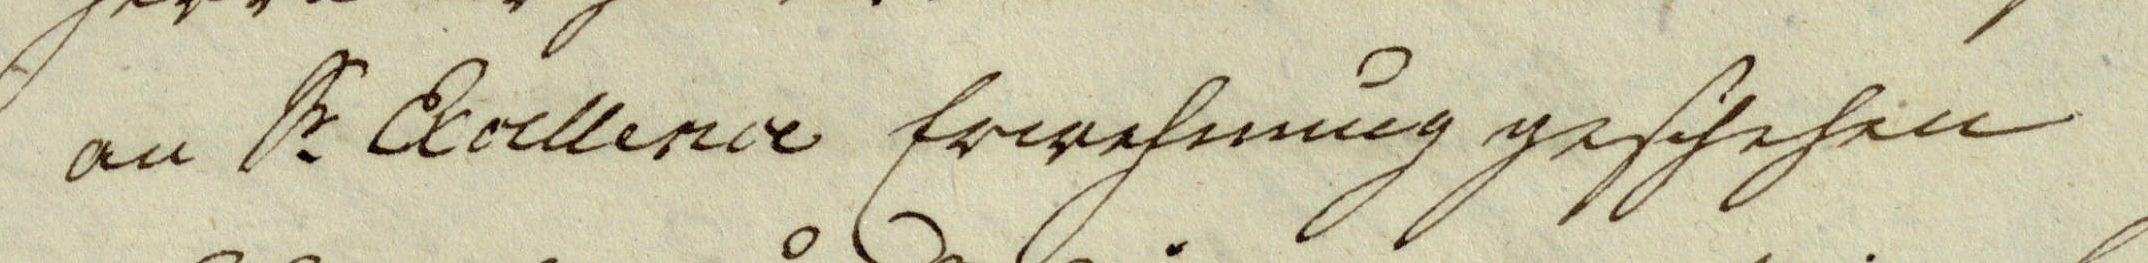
an Sr Excellence Erwehnung geschehen
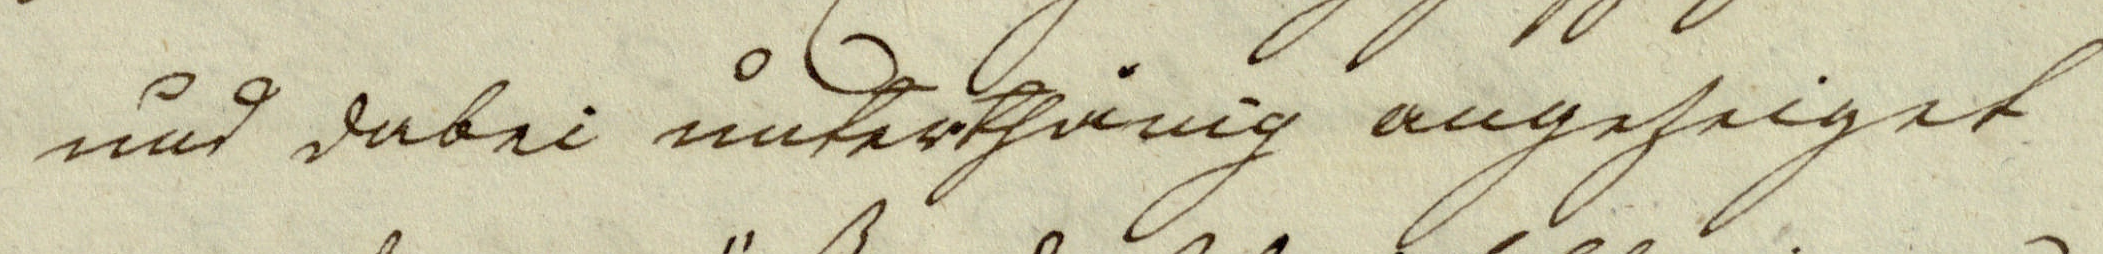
und dabei unterthänig angezeiget
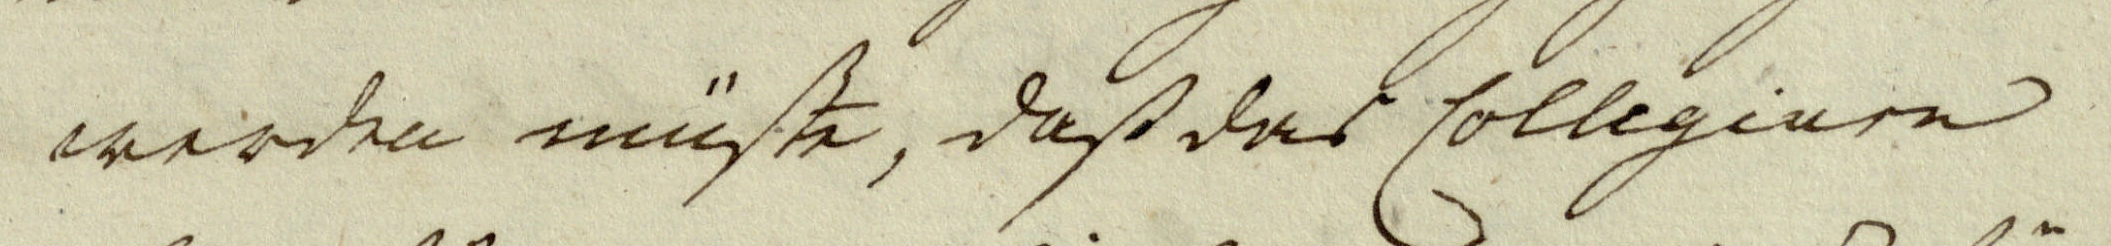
werden müßte, daß das Collegium
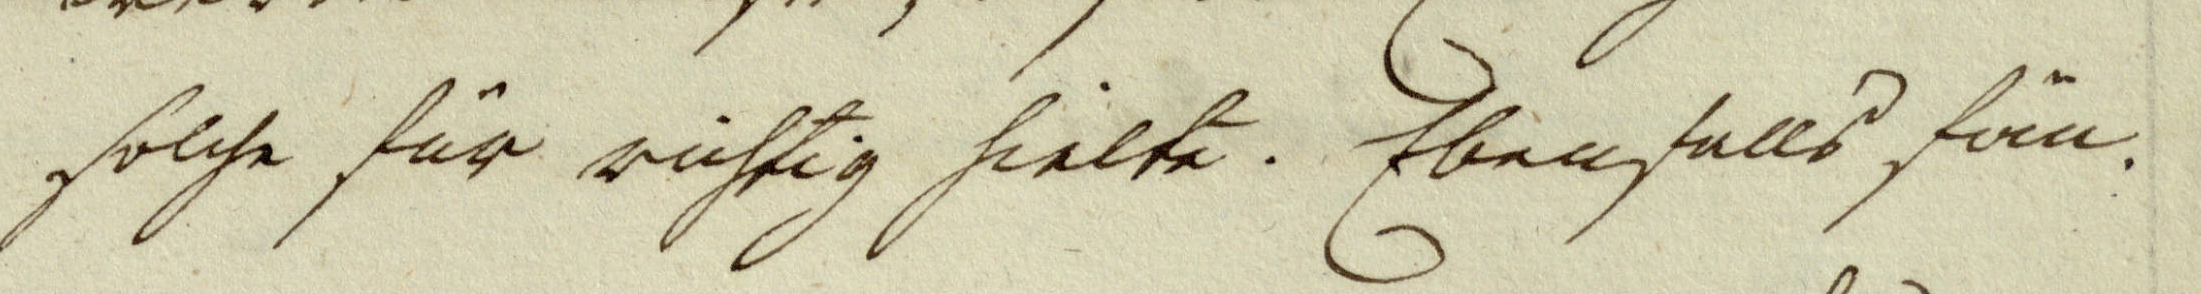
solche für richtig hielte. Ebenfalls fän¬
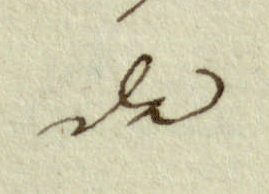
de
